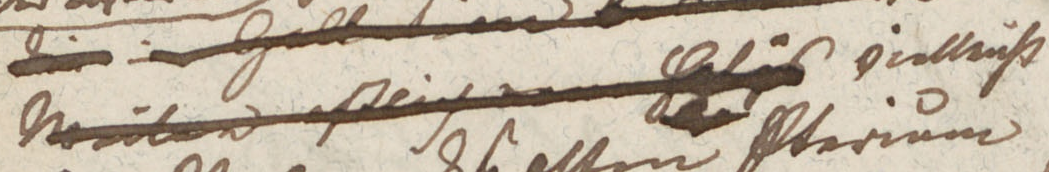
Meilen ostlich von vielleicht
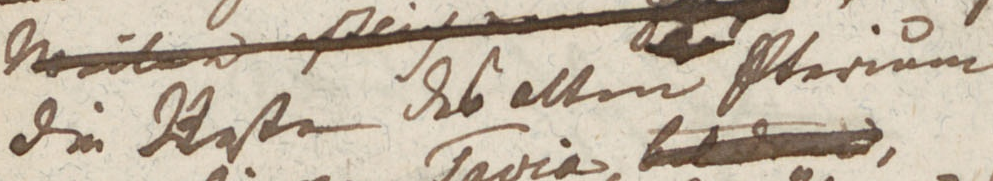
die Reste des alten Pterium
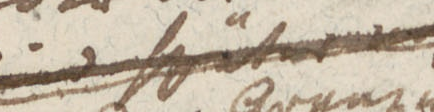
sind später noch
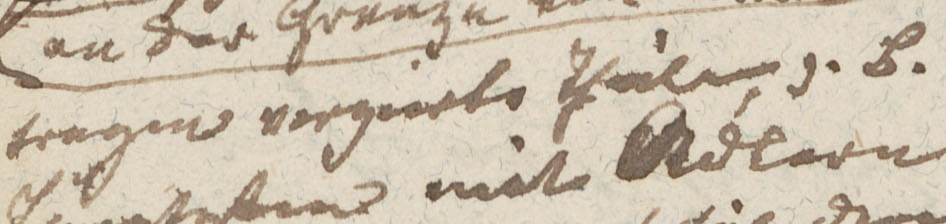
tragen verzierte Theile, z. B.
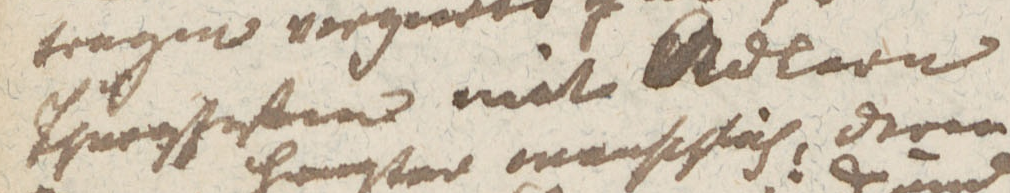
Thürpfosten mit Adlern
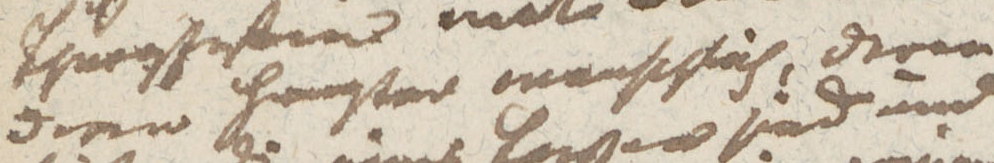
deren Haupter menschlich, deren
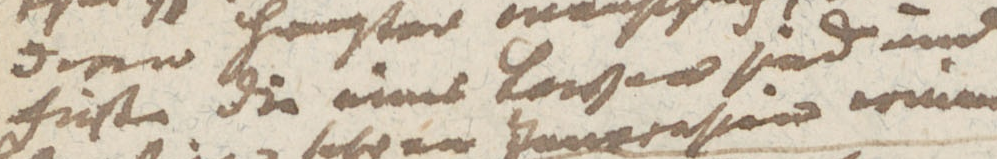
Füsse die eines Lowen sind und
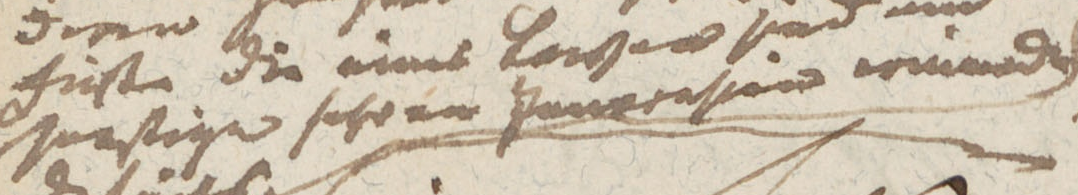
sonstige sehr an Innerasien erinnernde
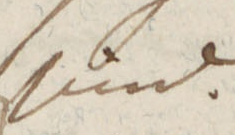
Gegend des
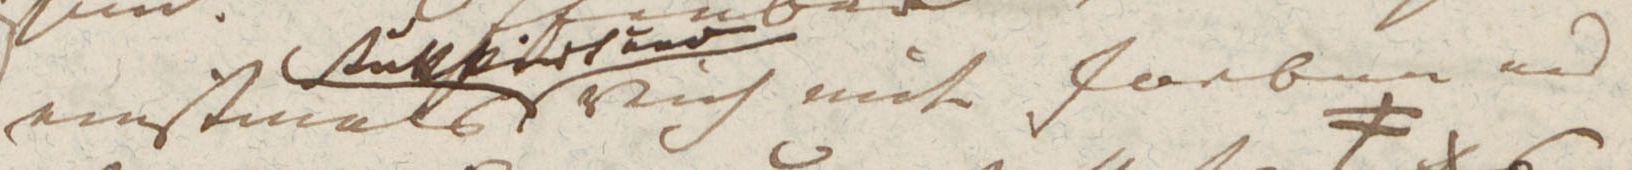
einstmals stukkirt und reich mit Farben und
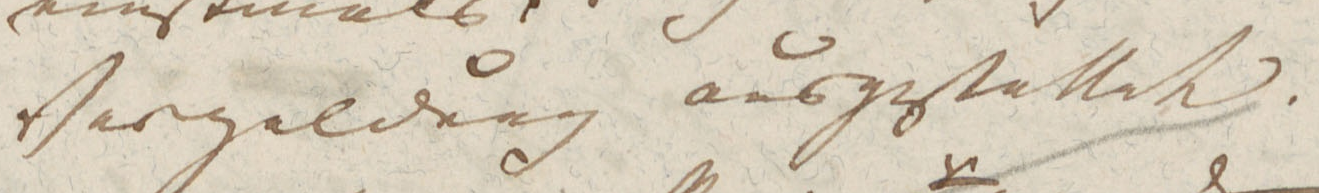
Vergoldung ausgestattet. %
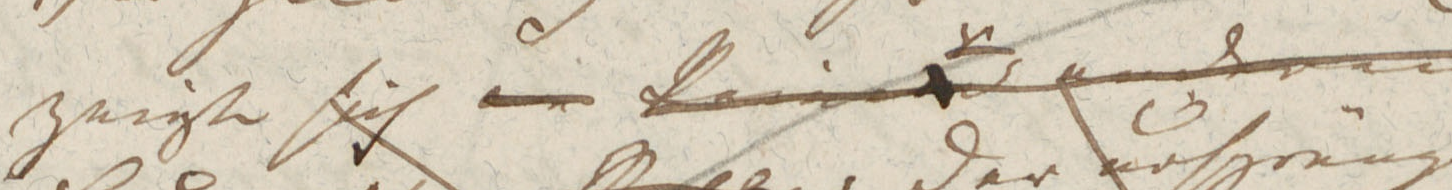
zeigt sich in keinemr anderen
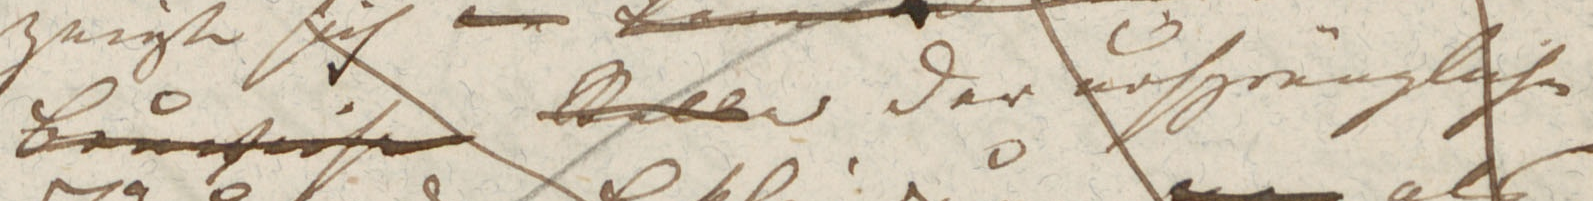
Bauweise Stelle der ursprüngliche
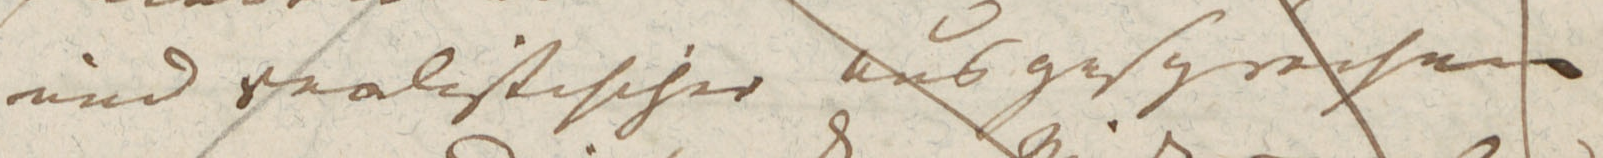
und realistischer ausgesprochen
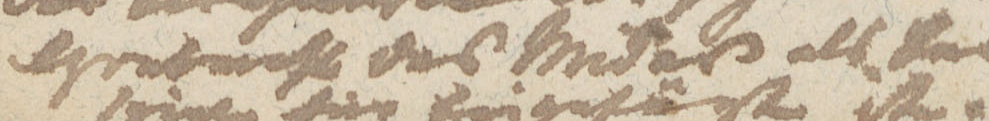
Grabmahl des Midas als Bei-
